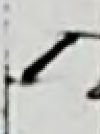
I
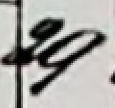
29
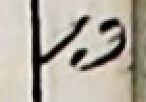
13
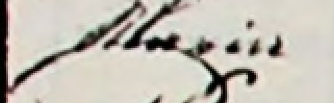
Maria
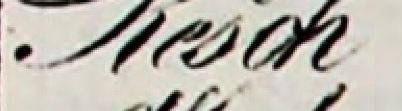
Resch
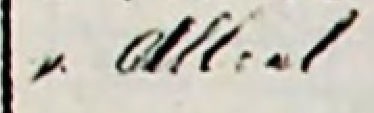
v. Albert
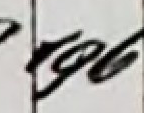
196
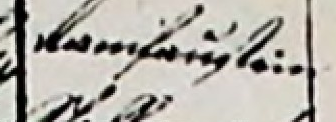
Ranifaustin
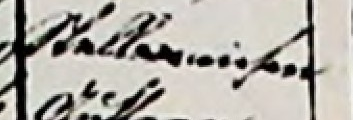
Stell???iesen
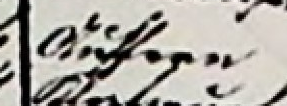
Ausseen
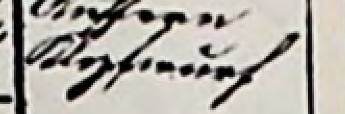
Klopfwurf
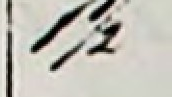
1½
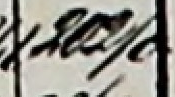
202/o
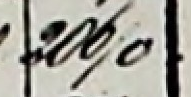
206/o
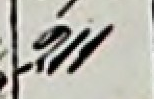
211
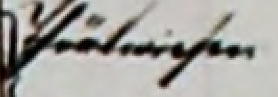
th???Wiesen
